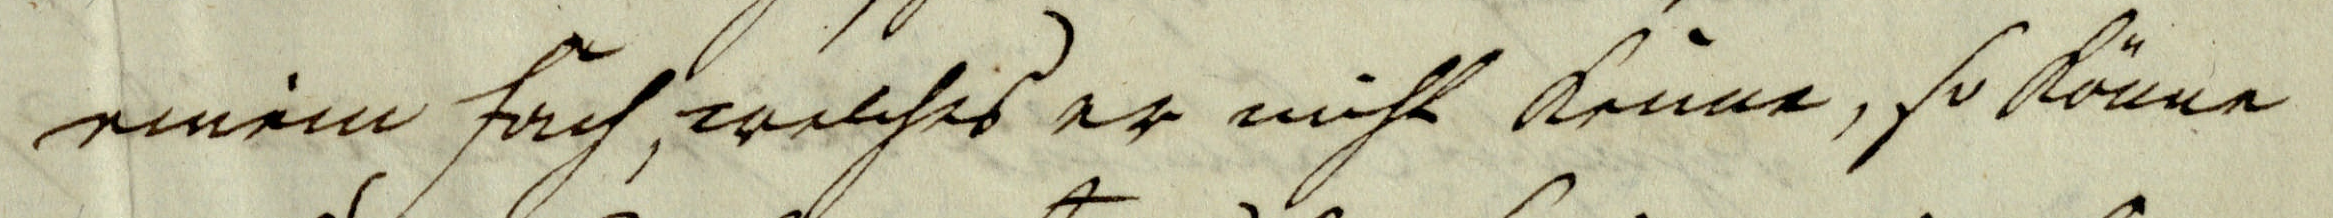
einem Fach, welches er nicht kenne, so könne
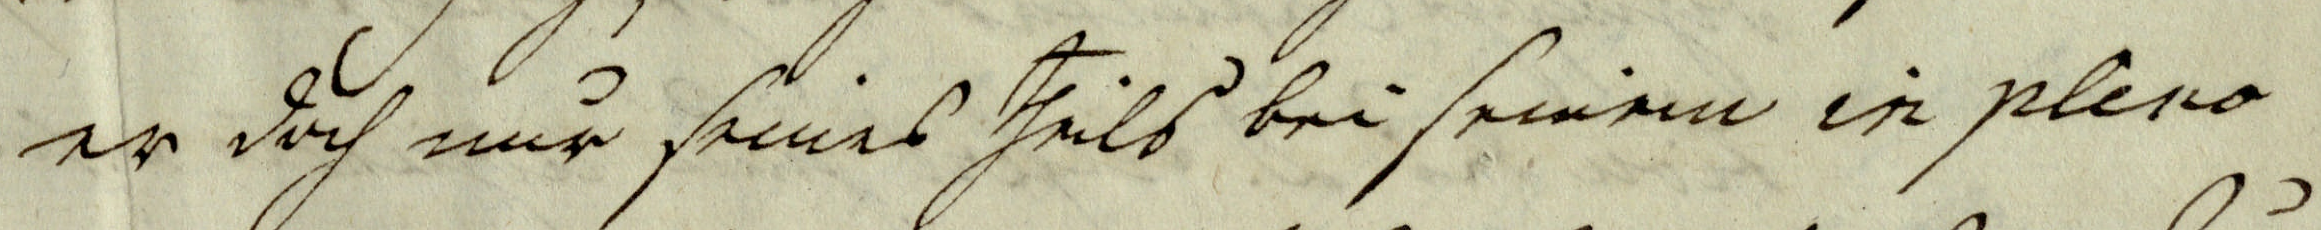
er doch nur seines Theils bei seinem in pleno
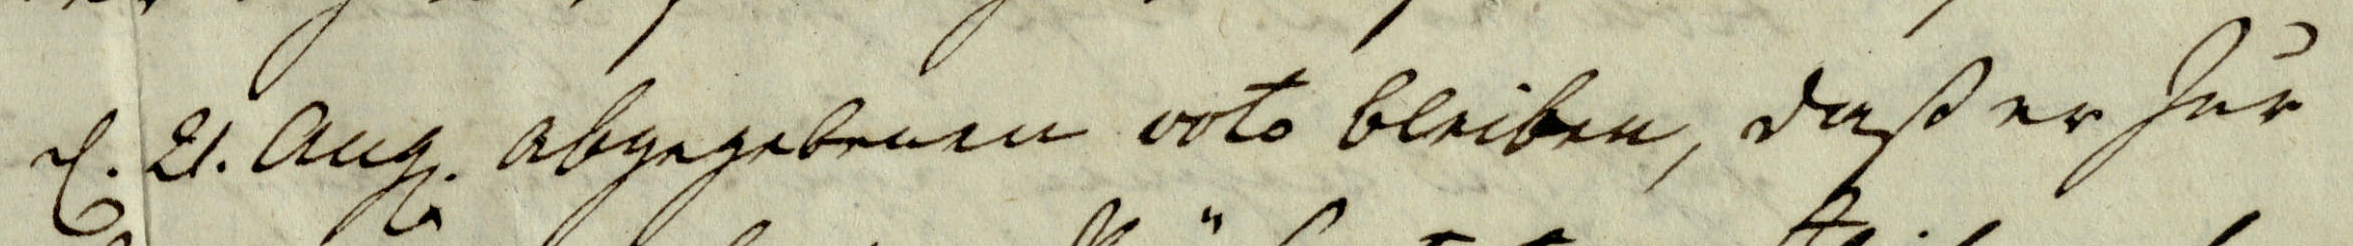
d. 21. Aug. abgegebenen voto bleiben, daß er zur
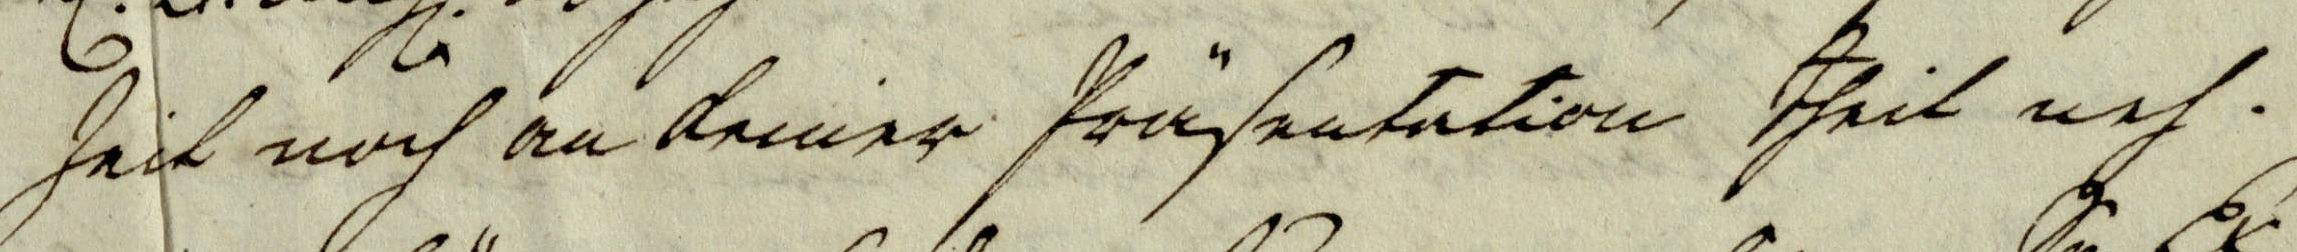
Zeit noch an keiner Präsentation Theil neh¬
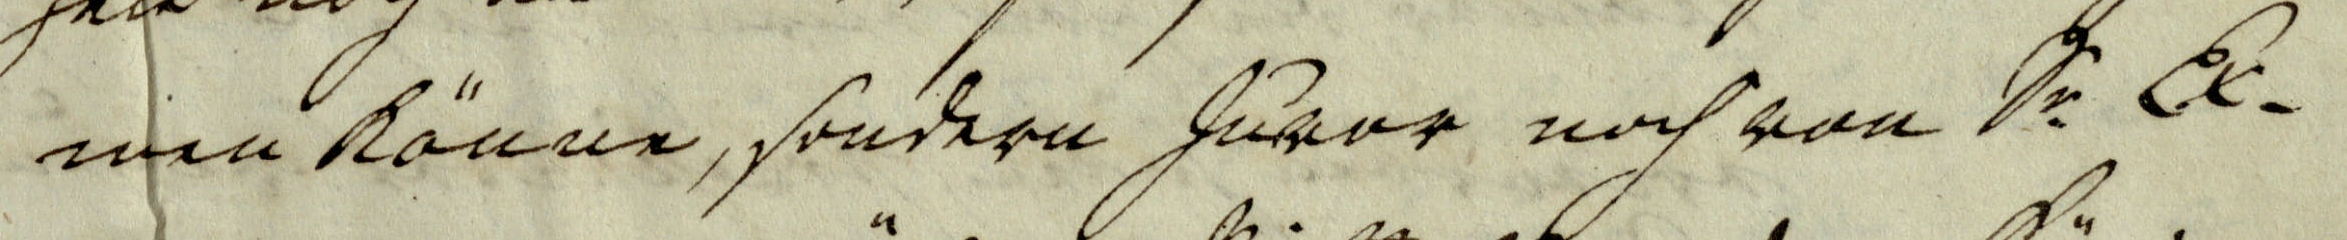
men könne, sondern zuvor noch von Sr. Ex¬
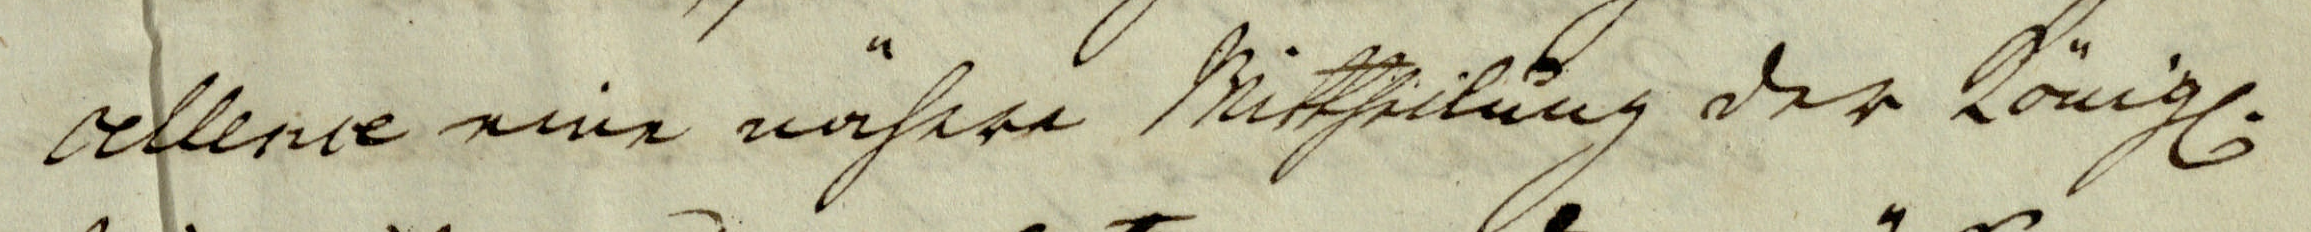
cellence eine nähere Mittheilung der Königl.
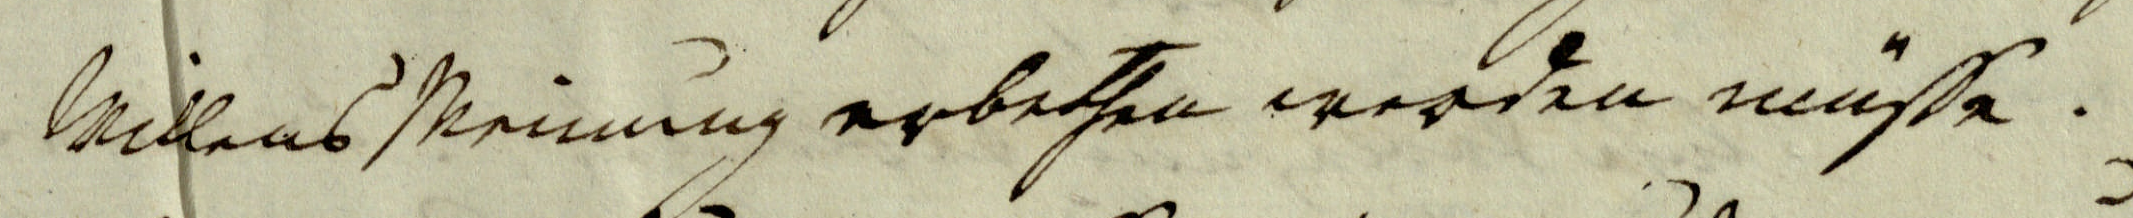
Willens Meinung erbethen werden müsse.
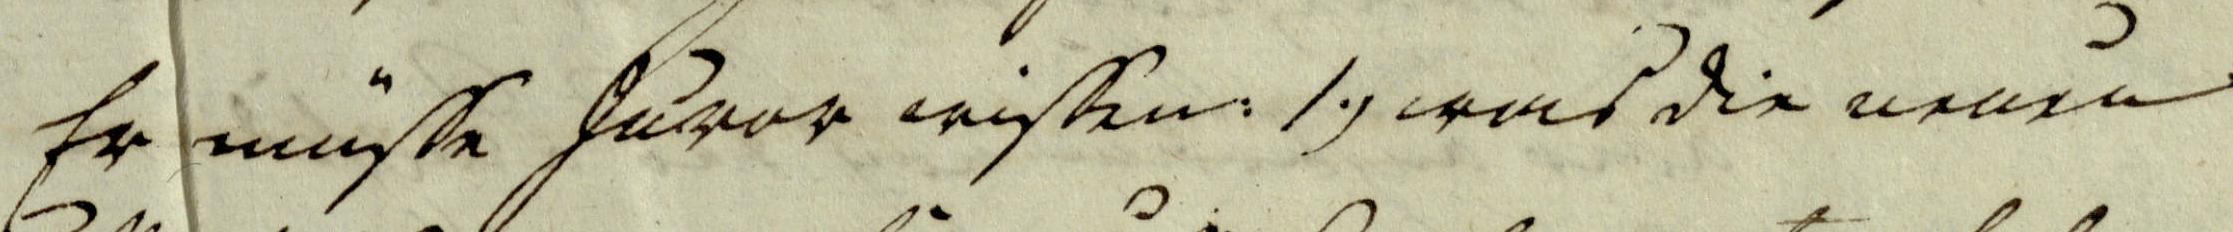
Er müsse zuvor wissen: 1., was die neuen
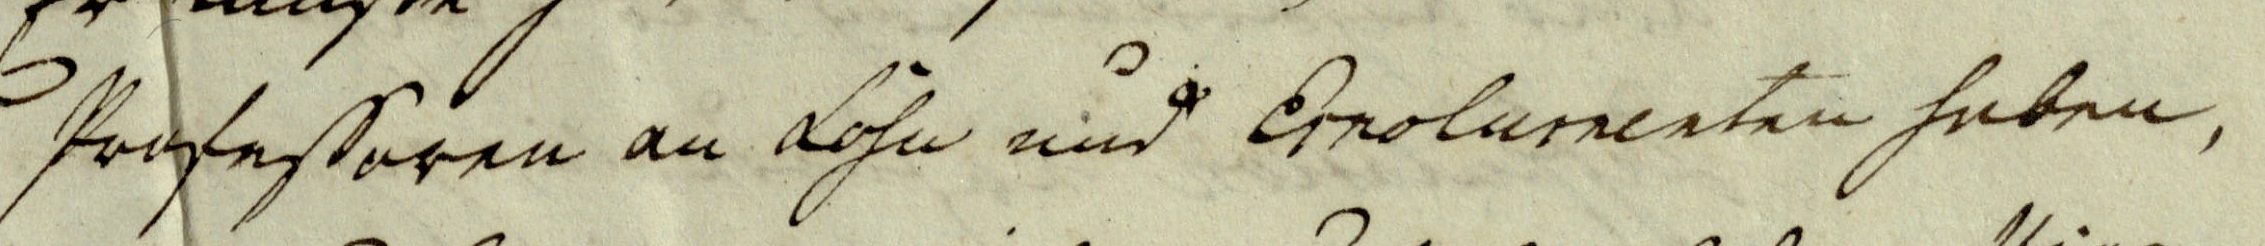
Professoren an Lohn und Emolumenten haben,
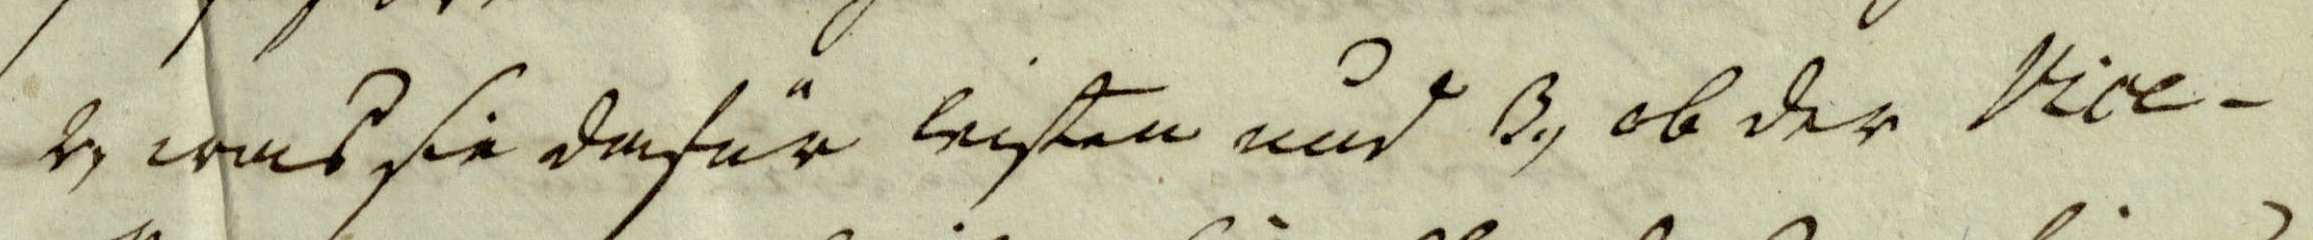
2., was sie dafür leisten und 3., ob der Vice¬
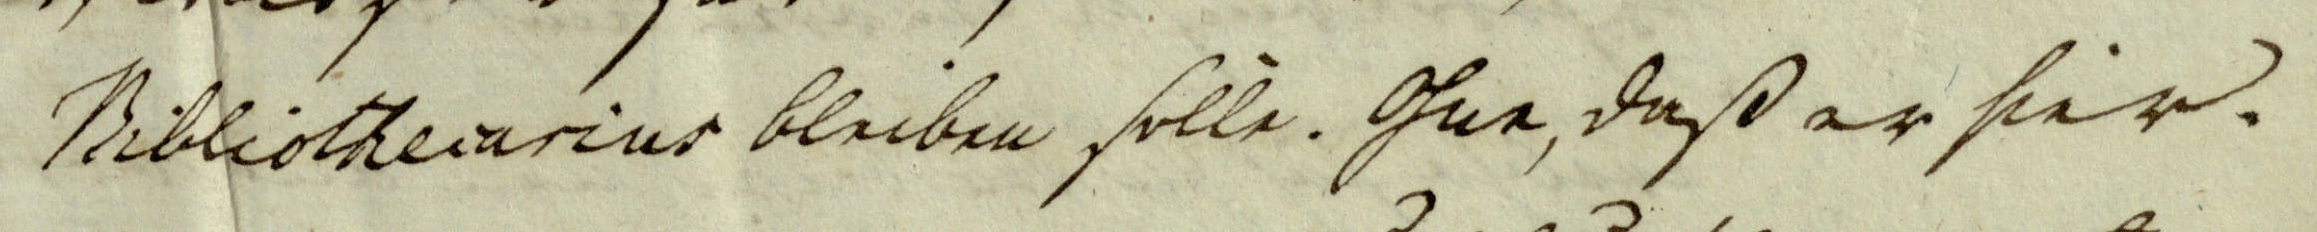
Bibliothecarius bleiben solle. Ohne, daß er hier¬
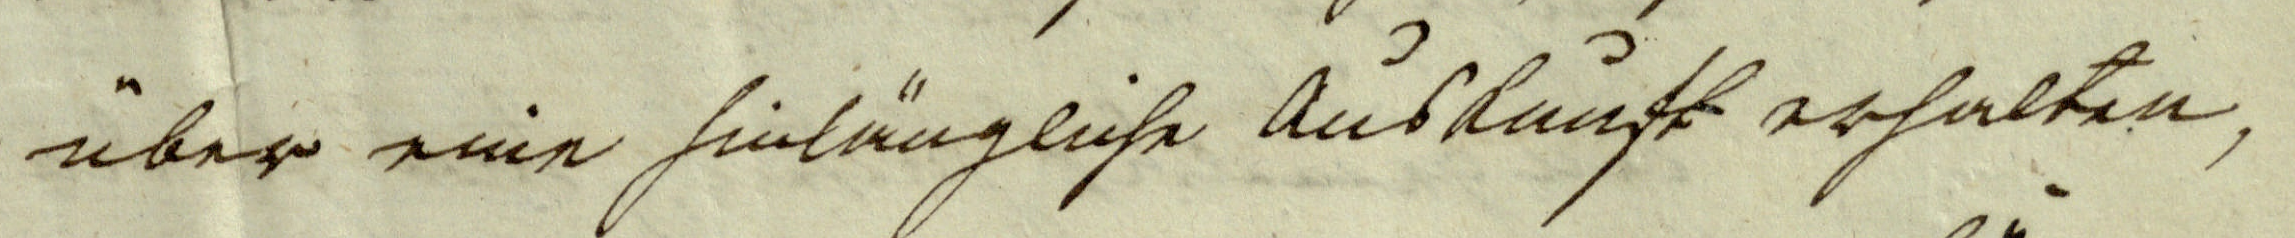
über eine hinlängliche Auskunft erhalten,
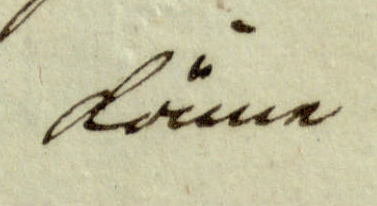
könne
